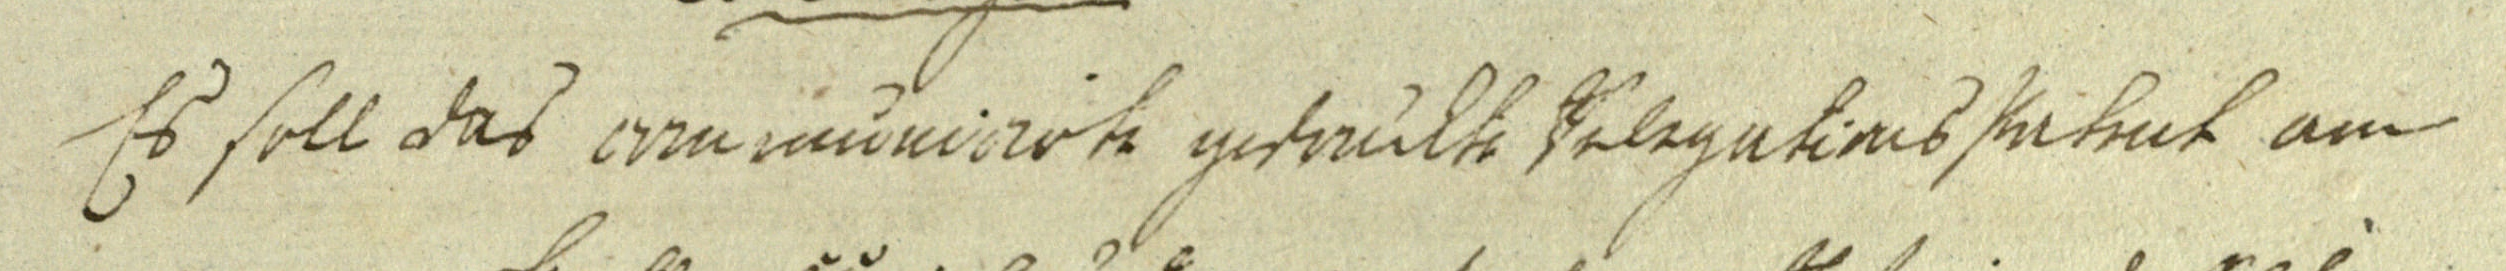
Es soll das communicirte gedruckte RelegationsPatent am
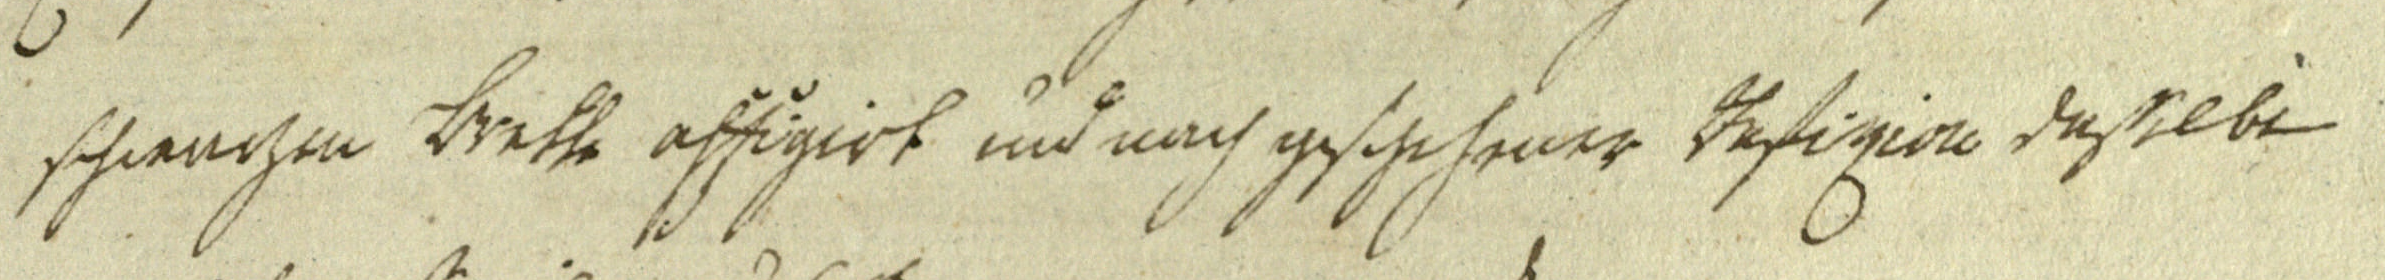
schwarzen Brette affigirt und nach geschehener Resixion dasselbe
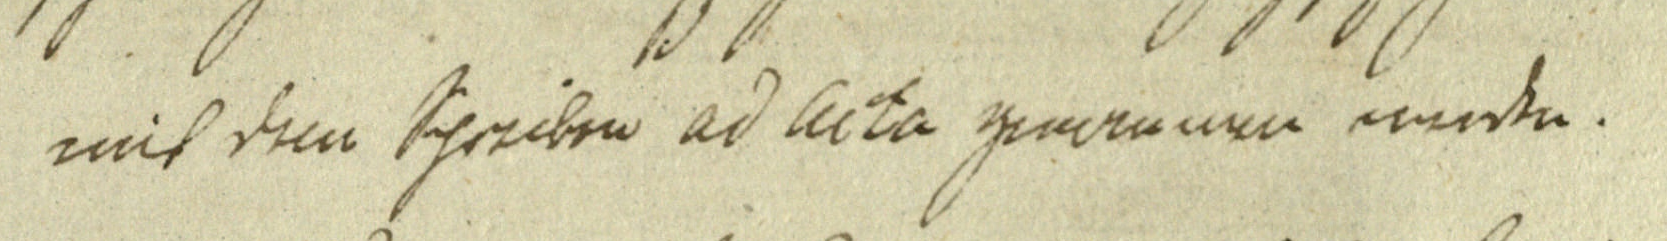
mit dem Schreiben ad Acta genommen werden.
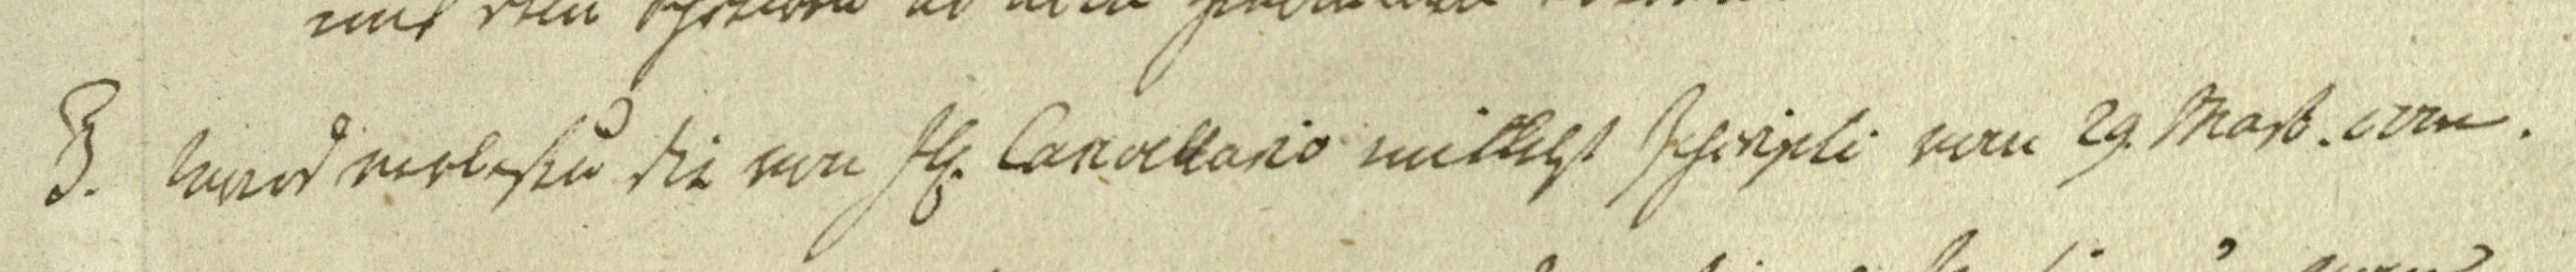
3. Ward verlesen die von Ill. Cancellario mittelst Rescripti vom 29. Mart. com¬
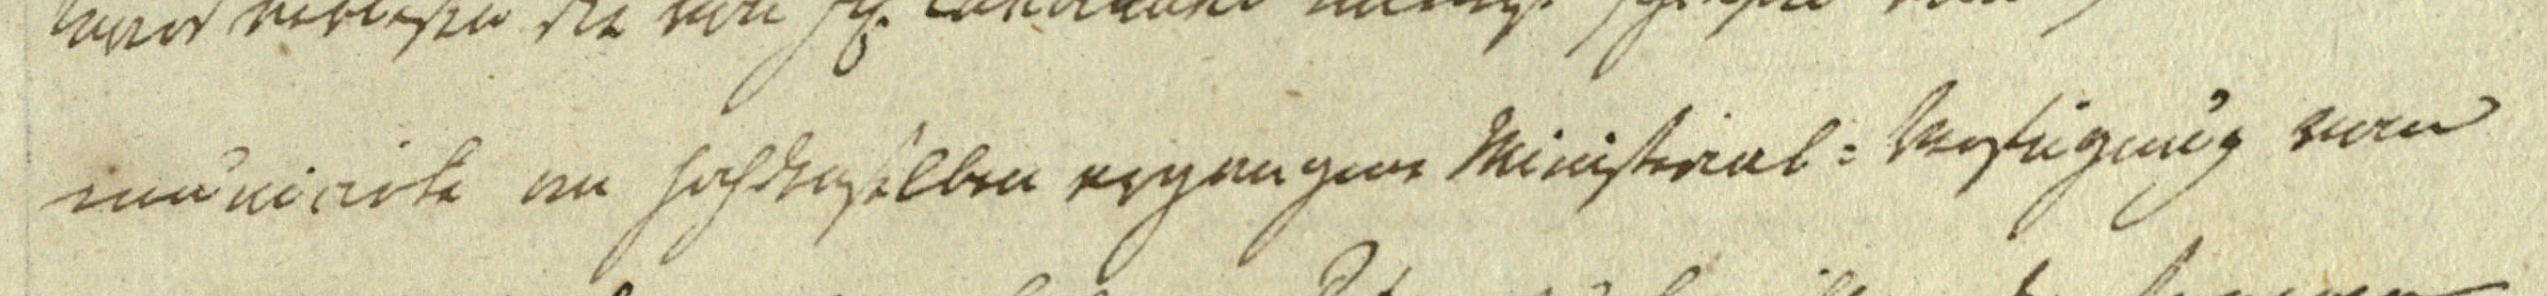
municirte an hochdenselben ergangene Ministerial- Verfügung vom
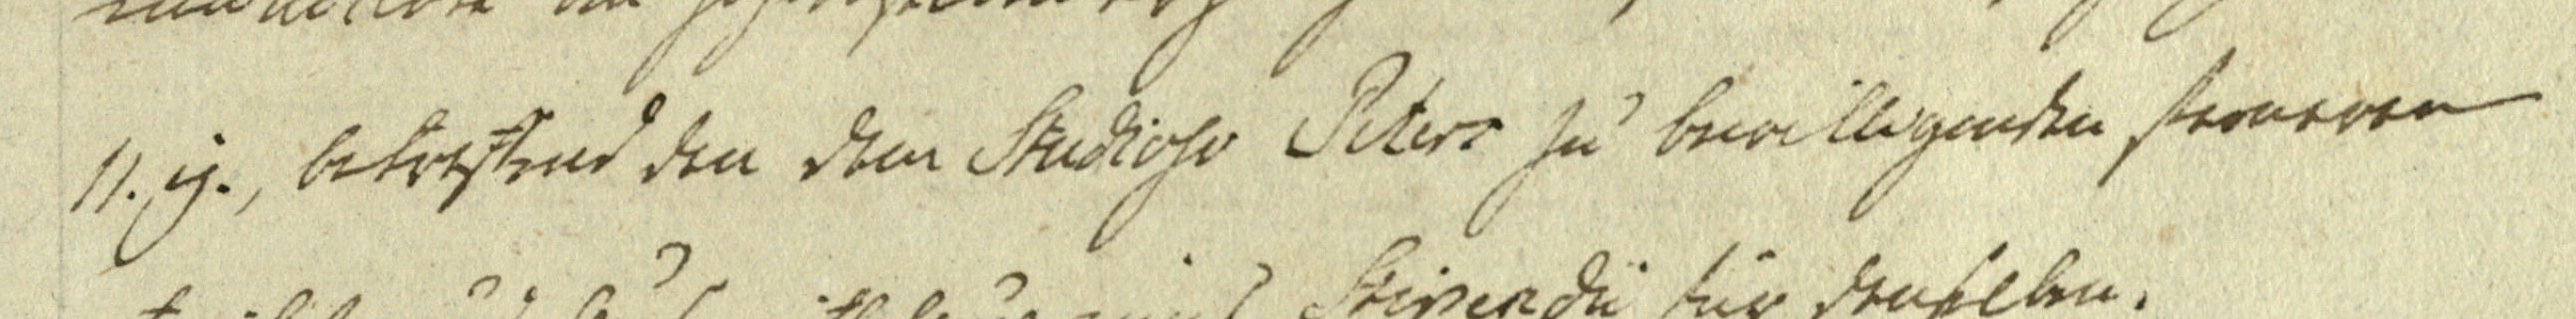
11. ej., betreffend den dem Studioso Peters zu bewilligenden ferneren
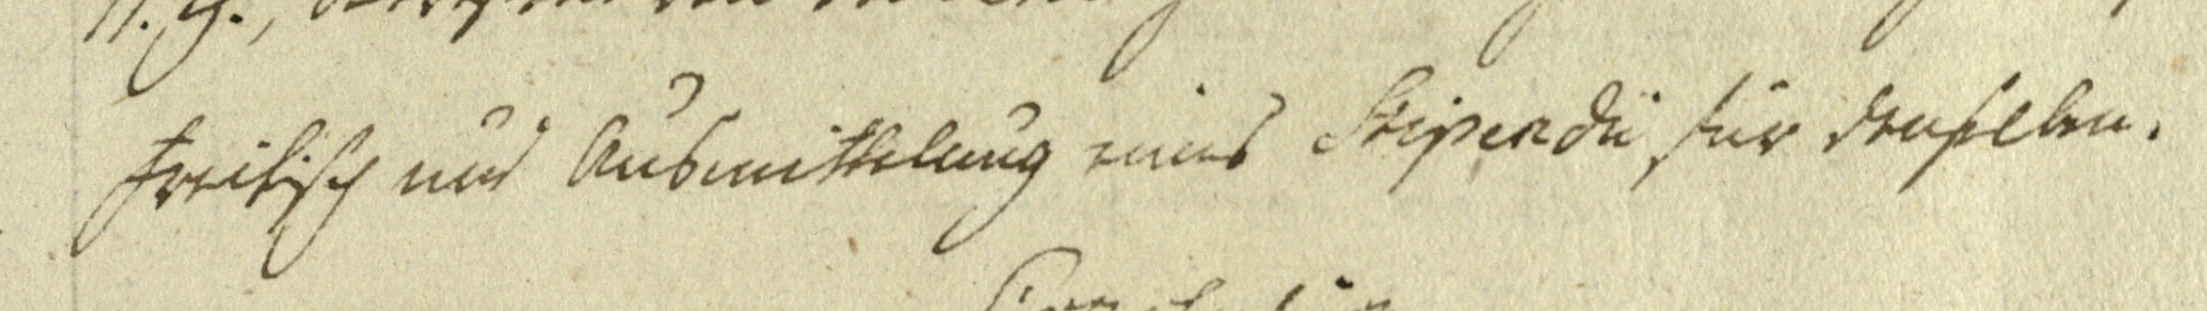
Freitisch und Ausmittelung eines Stipendii für denselben.
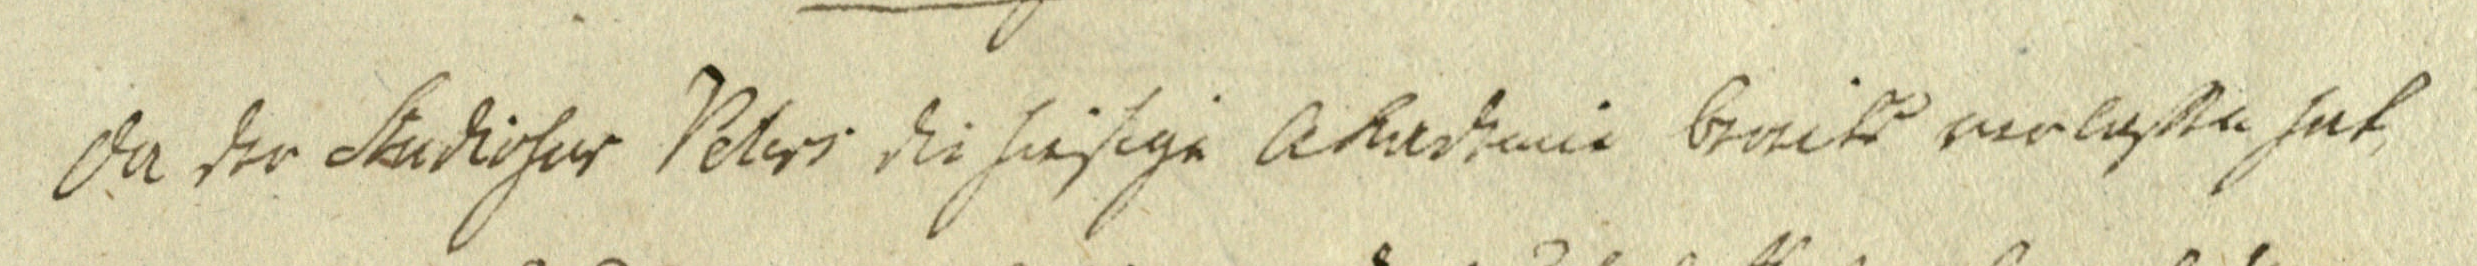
Da der Studiosus Peters die hiesige Akademie bereits verlassen hat,
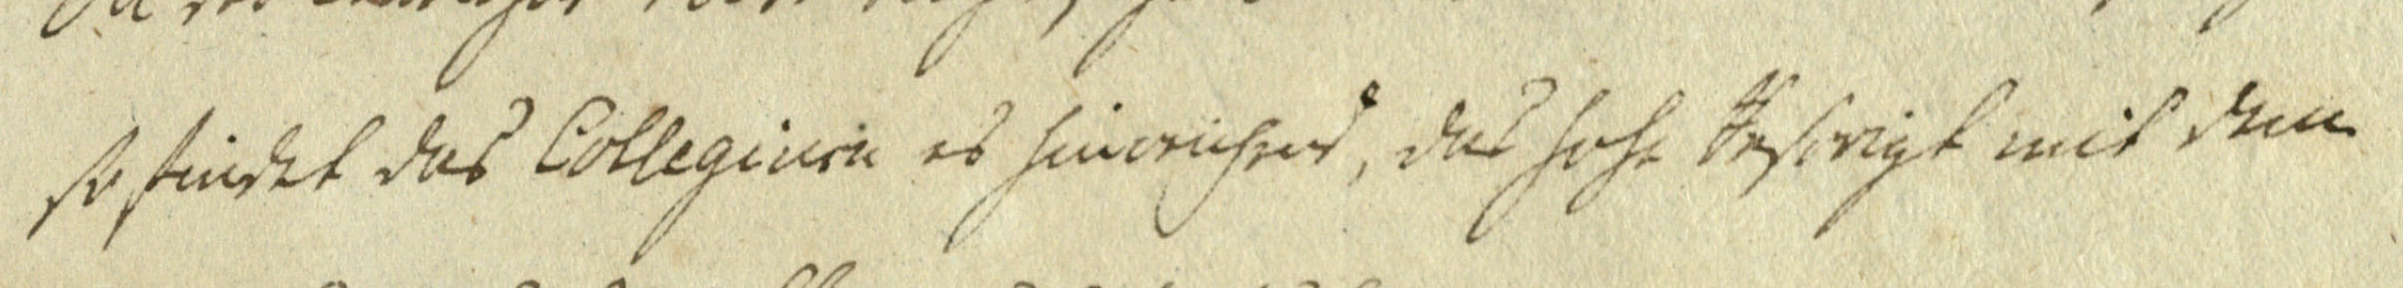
so findet das Collegium es hinreichend, das hohe Rescript mit dem
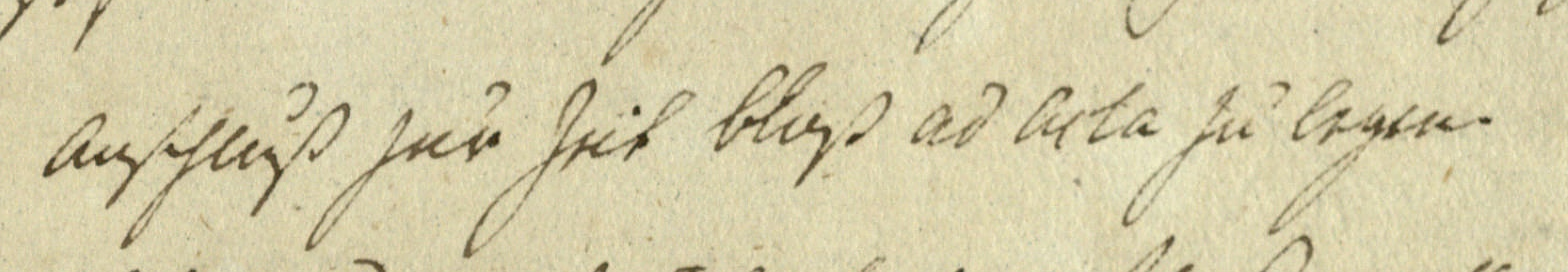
Anschluß zur Zeit bloß ad Acta zu legen.
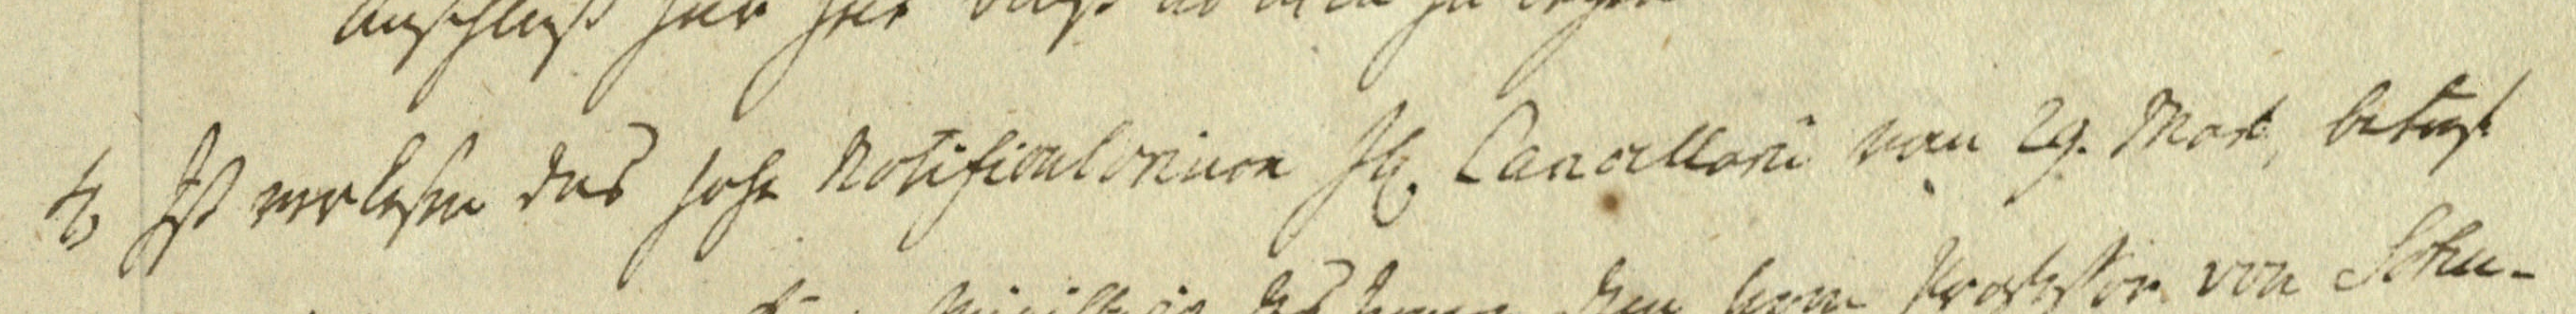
4. Ist verlesen das hohe Notificatorium Ill. Cancellarii vom 29. Mart, betref¬
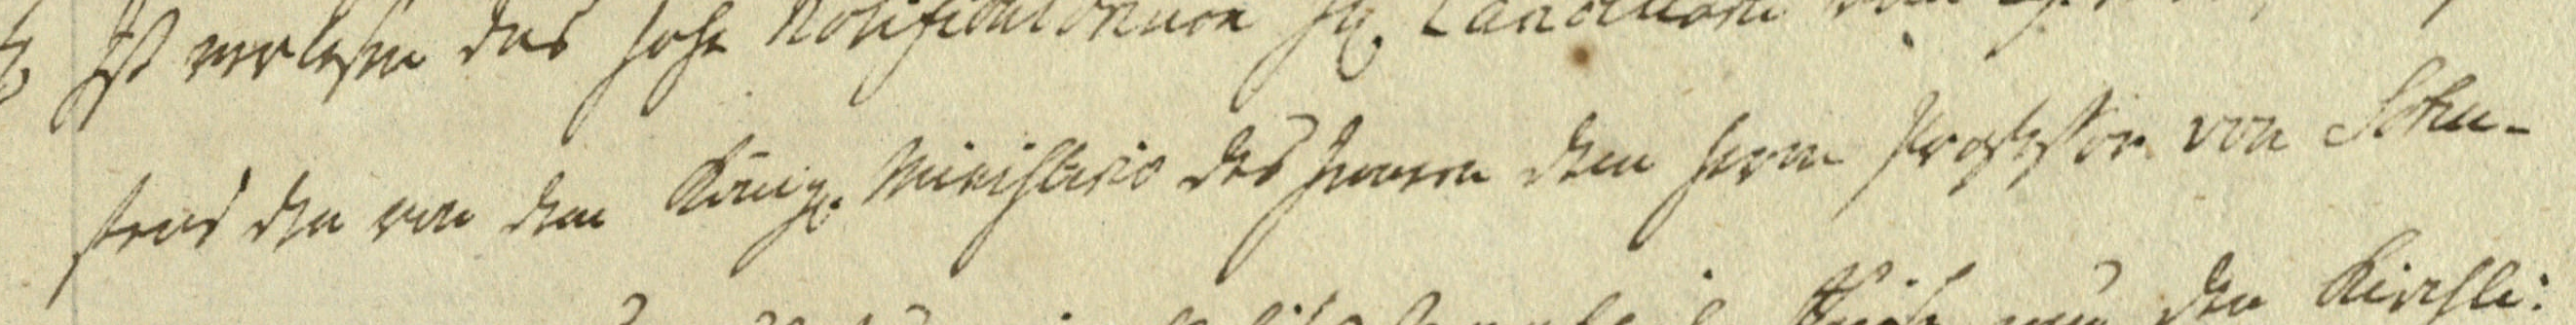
fend den von dem Königl. Ministerio des Innern dem Herrn Professor von Schu¬
